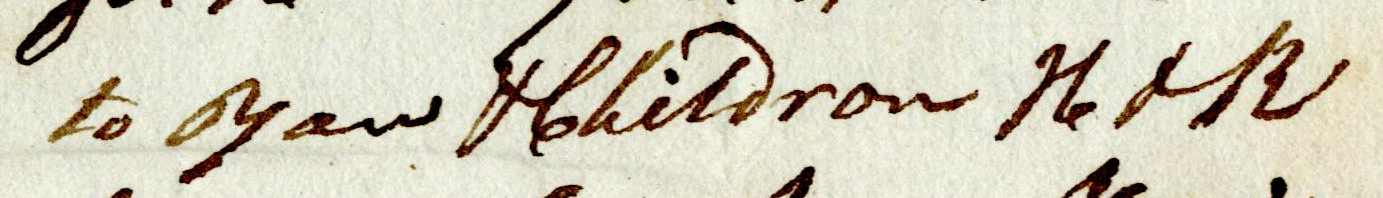to you & Children H & R
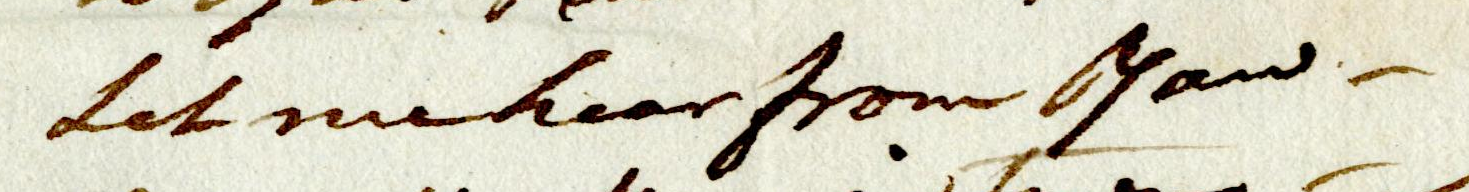Let me hear from you-
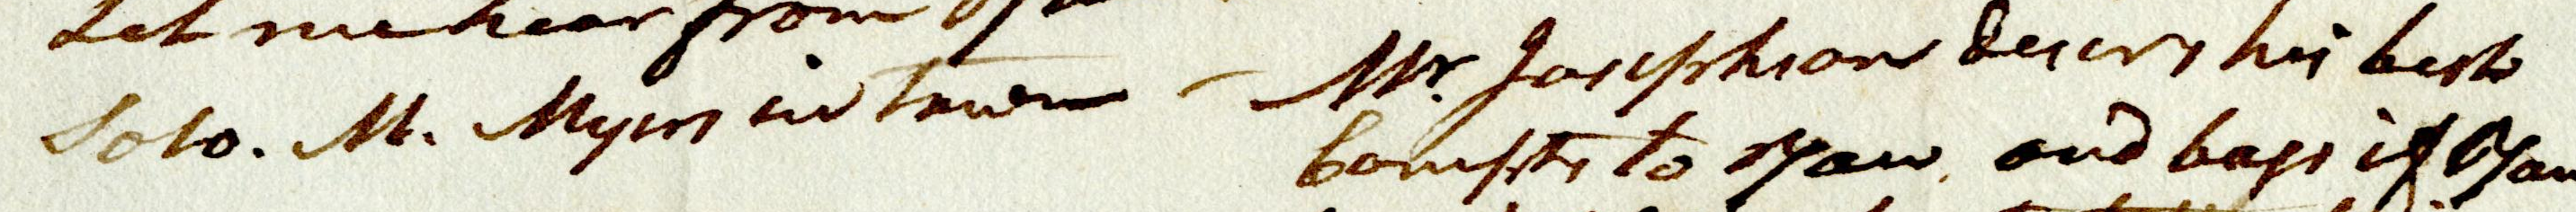Solo. M. Myers in town.- M^r Josephson desirs his best
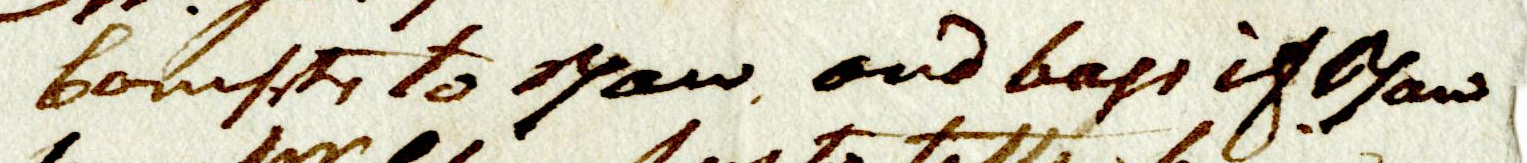Comp^ts to you, and begs if you
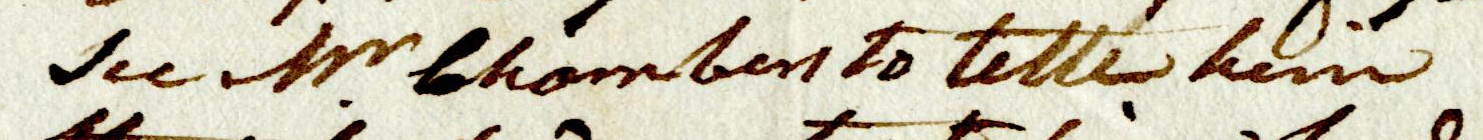see M^r Chambers to telle him
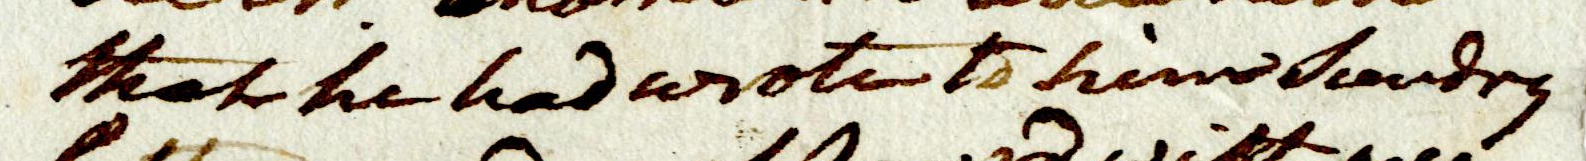that he had wrote to him Sundry
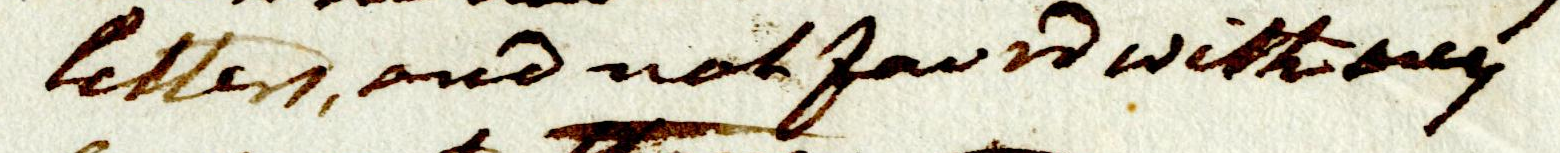letters, and not fav^rd with my
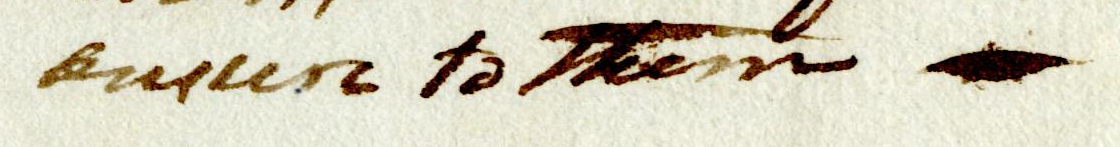ansure to them
